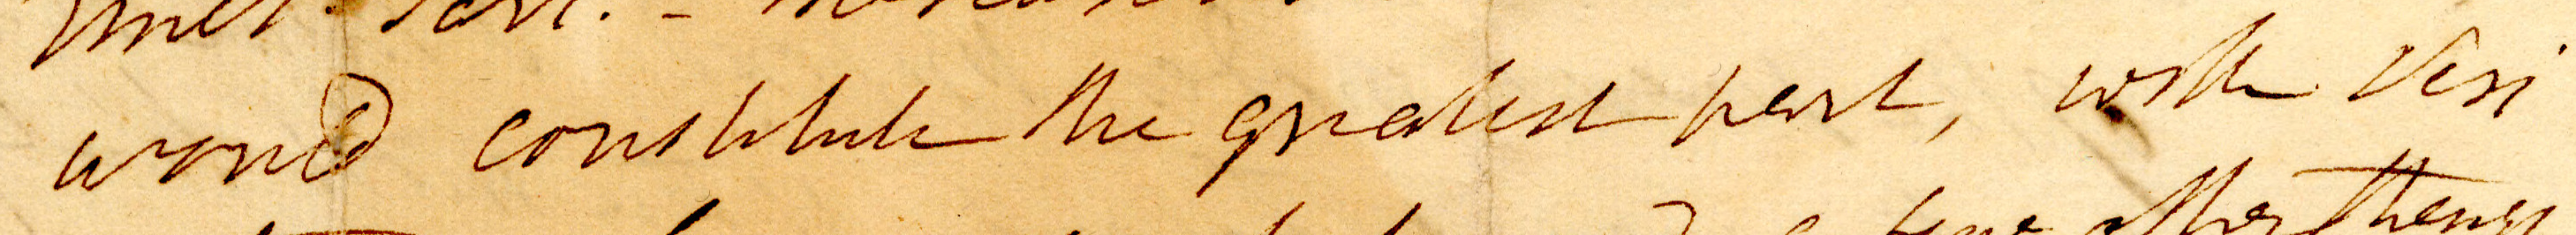would constitute the greatest part, with Vin
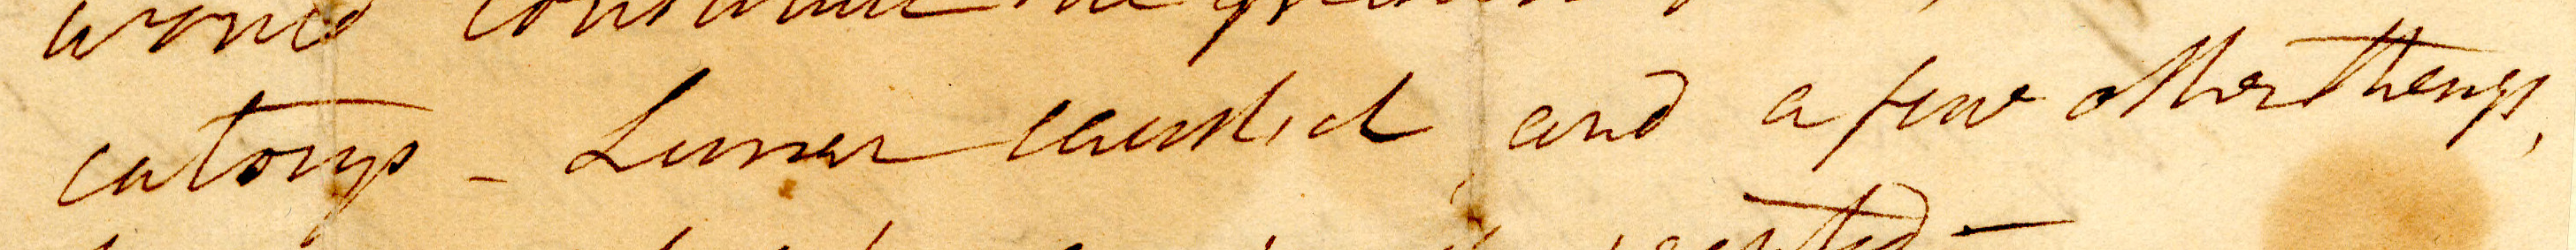catorys- Lunar caustick and a few other things,
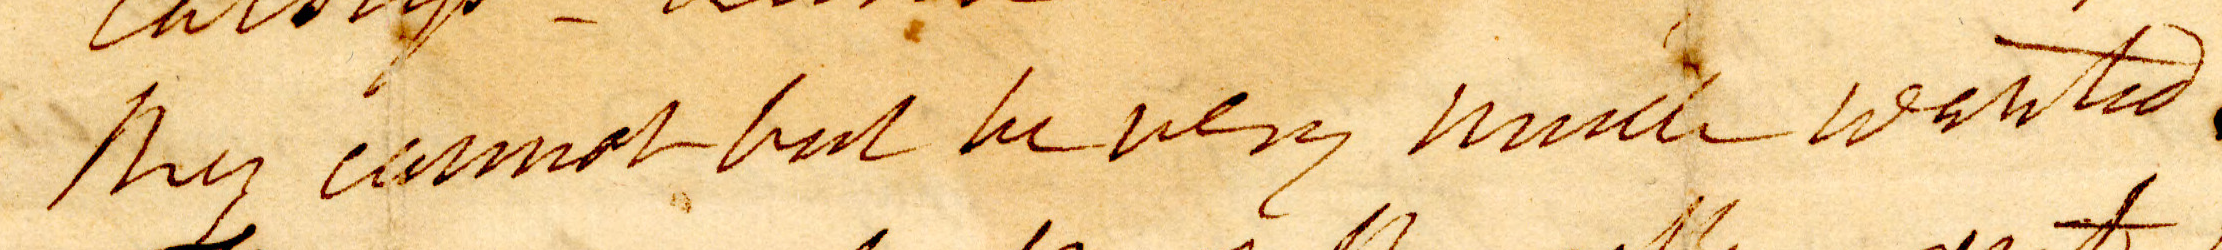they cannot but be very much wanted-
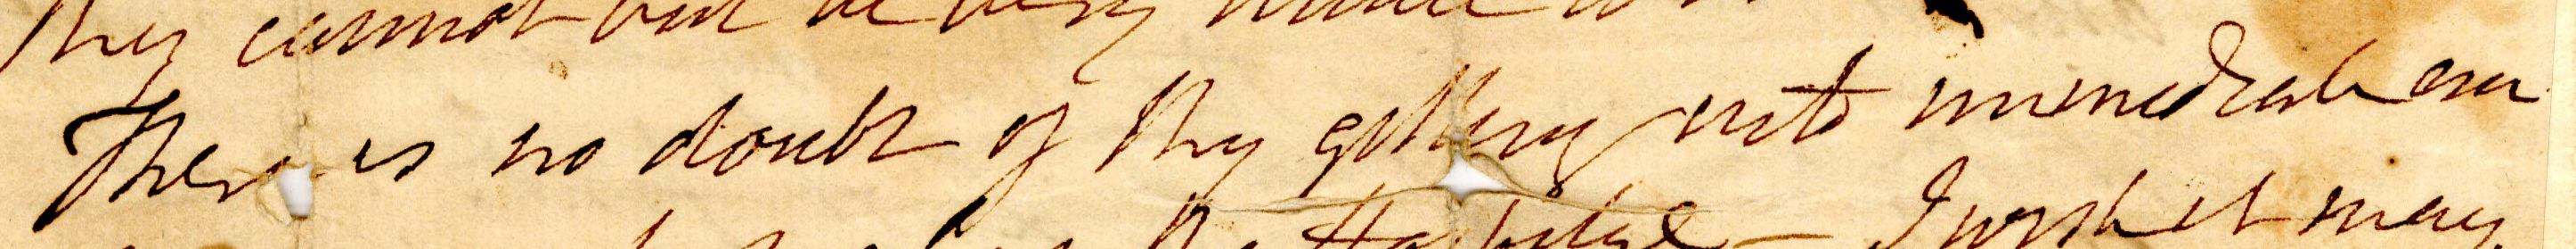Ther[_] is no doubt of thy getting into an medcal em
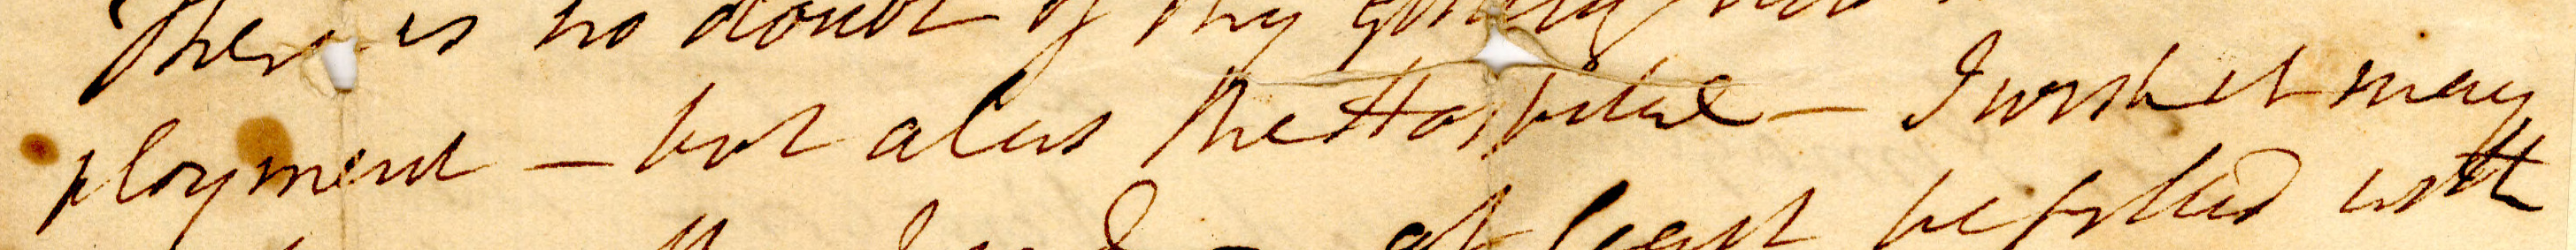ployment- but also the Hospital- I wish it may
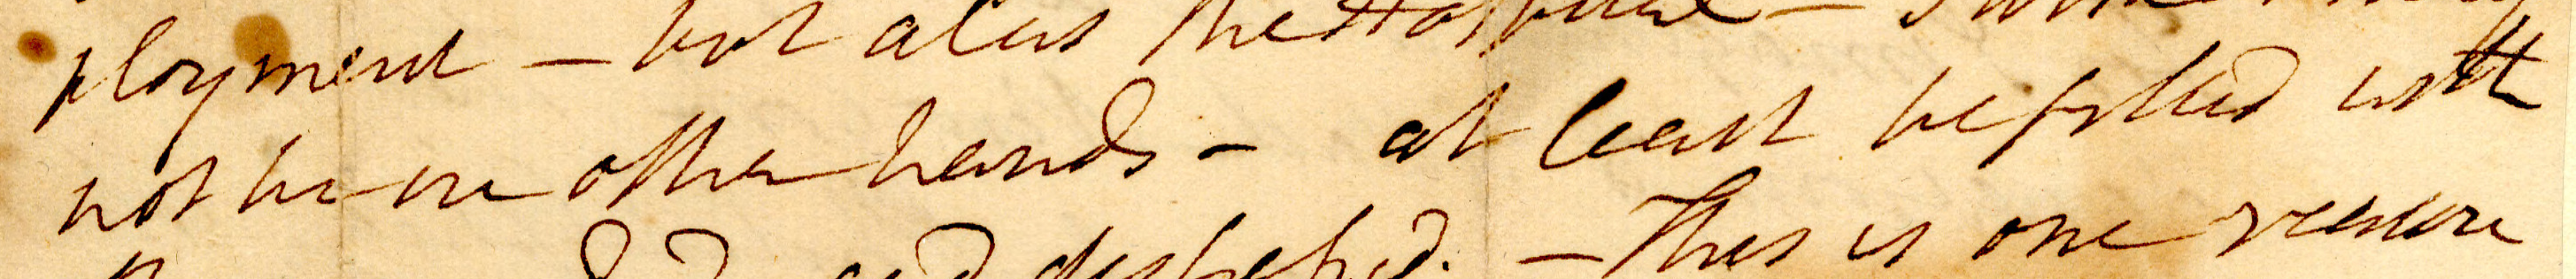not be in other hands- at least be filled with
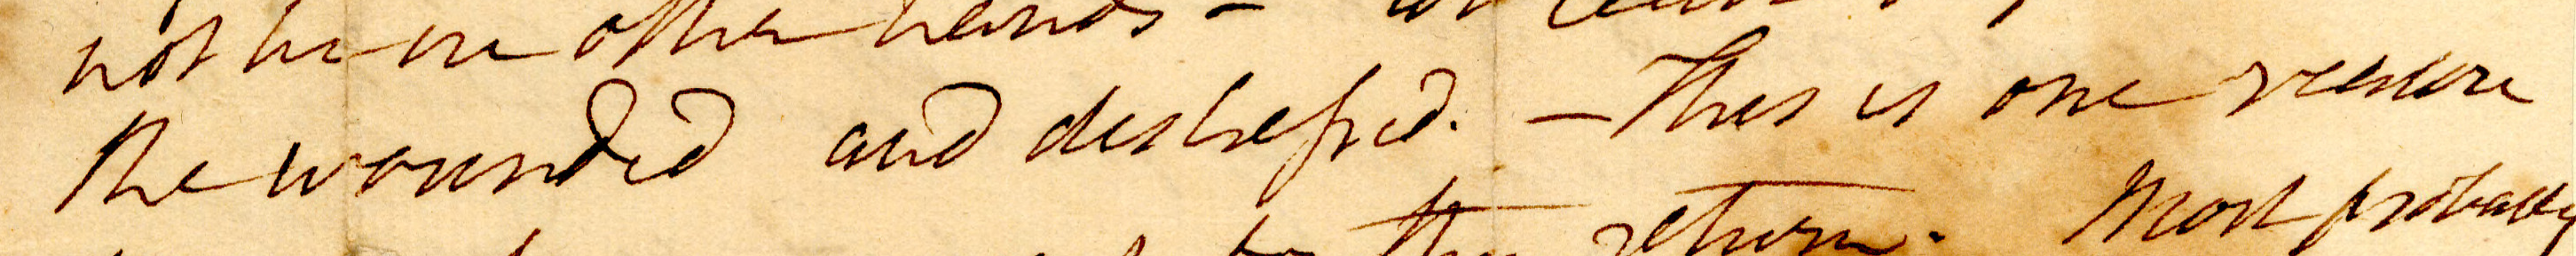the wounded and distressed- This is one reason
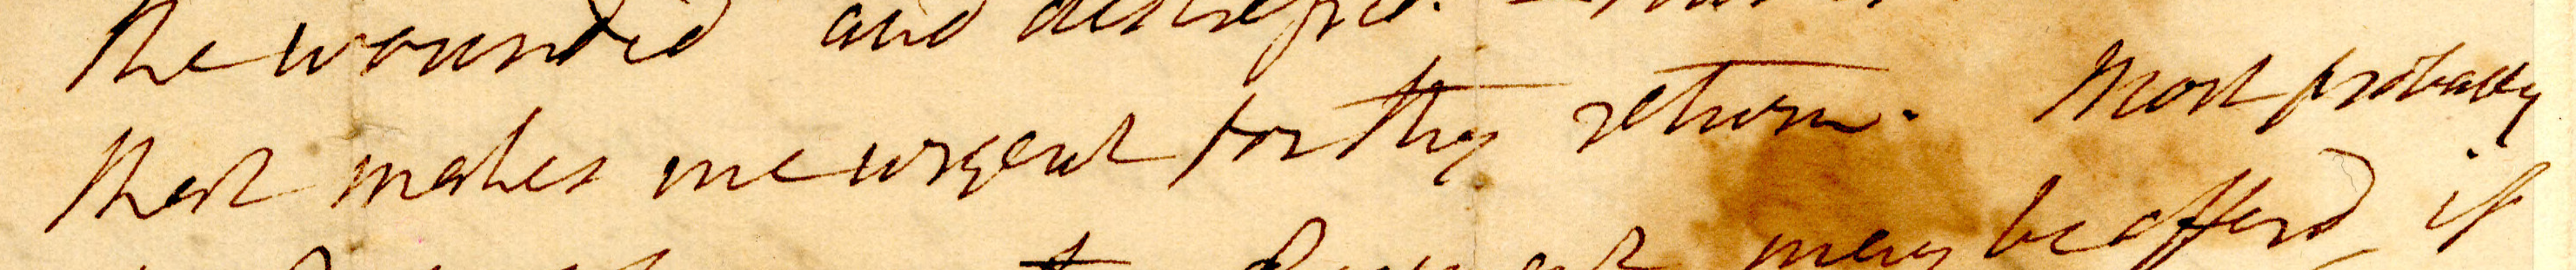that makes me urgent for thy return. Most probably
